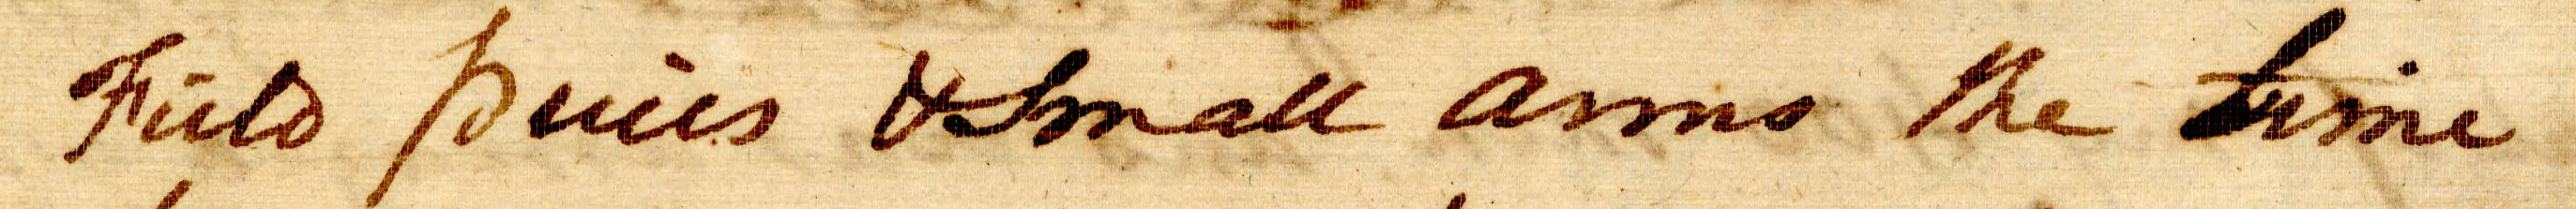Field Pieces & Small arms the time
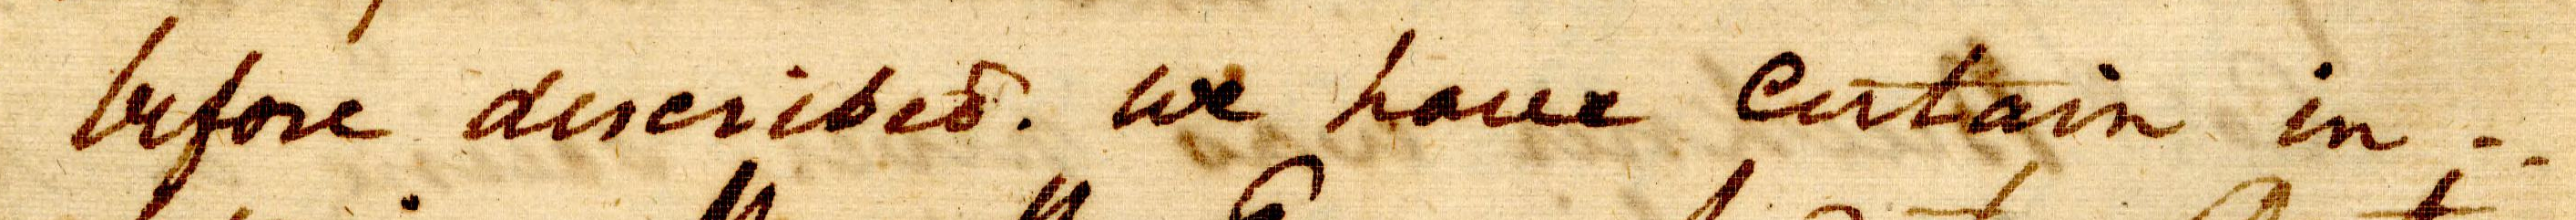before described. we have certain in-
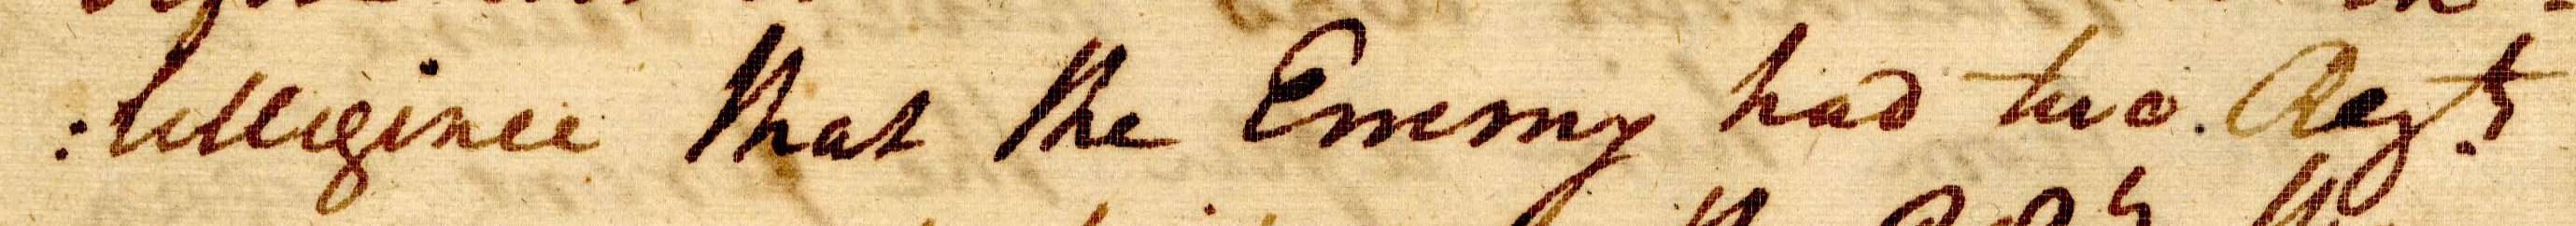-telligence that the Enemy had two Reg^ts.
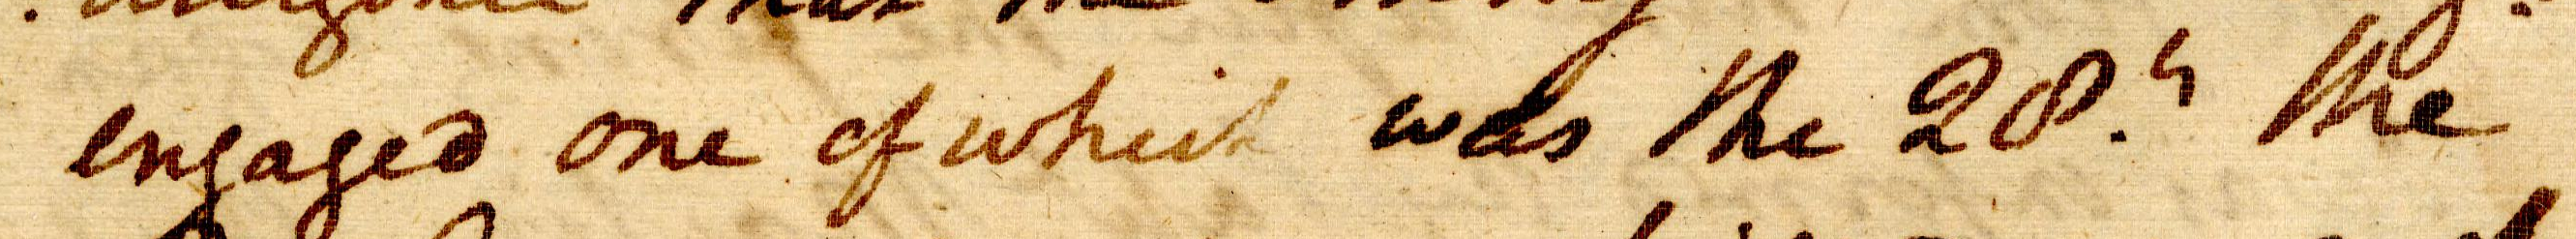engaged one of which was the 28^h. the
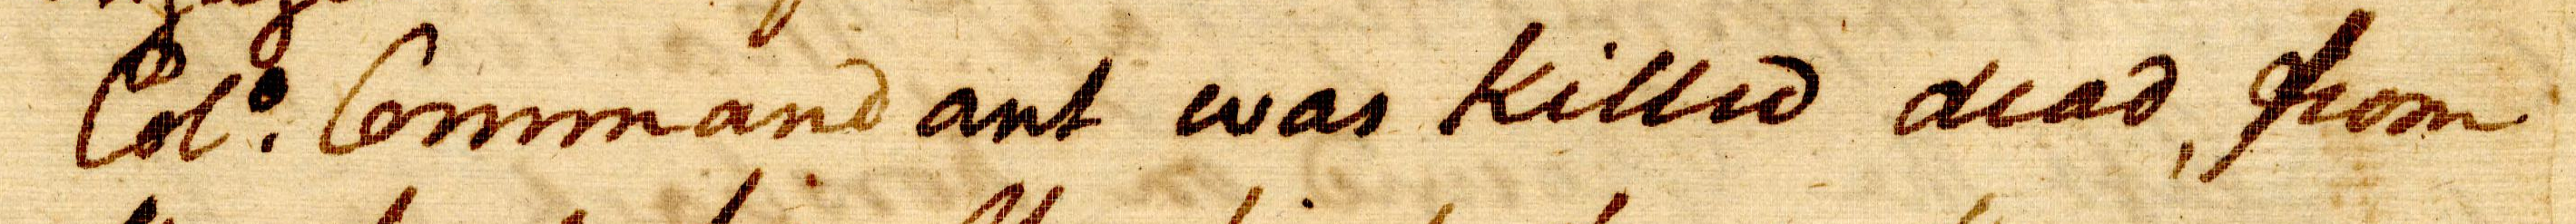Col^o. Commandant was killed dead, from
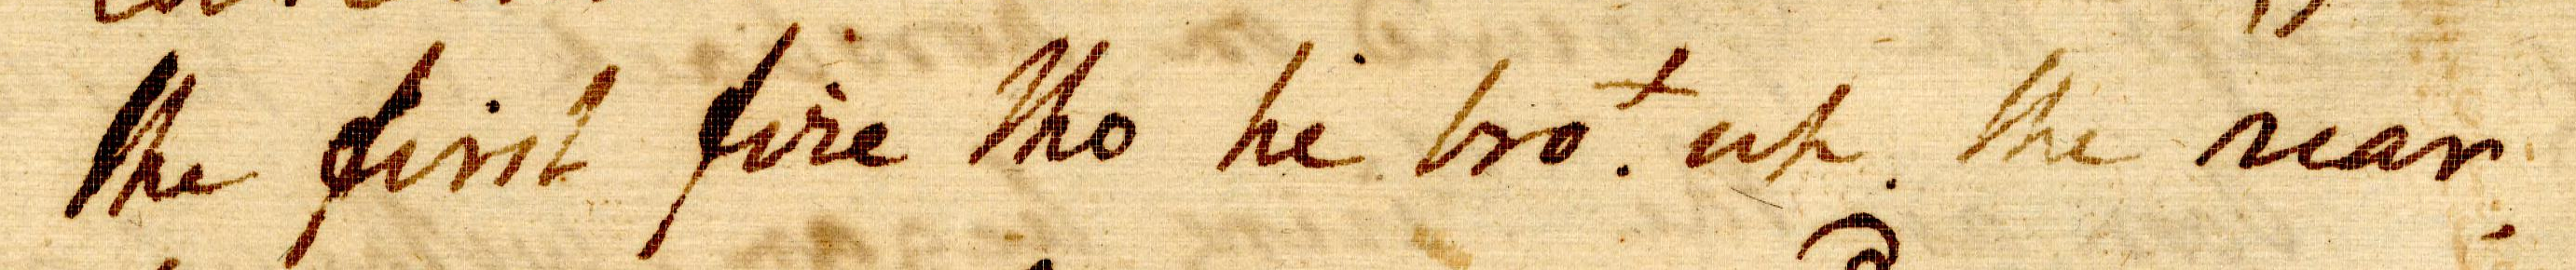the first fire tho he bro^t. up the rear
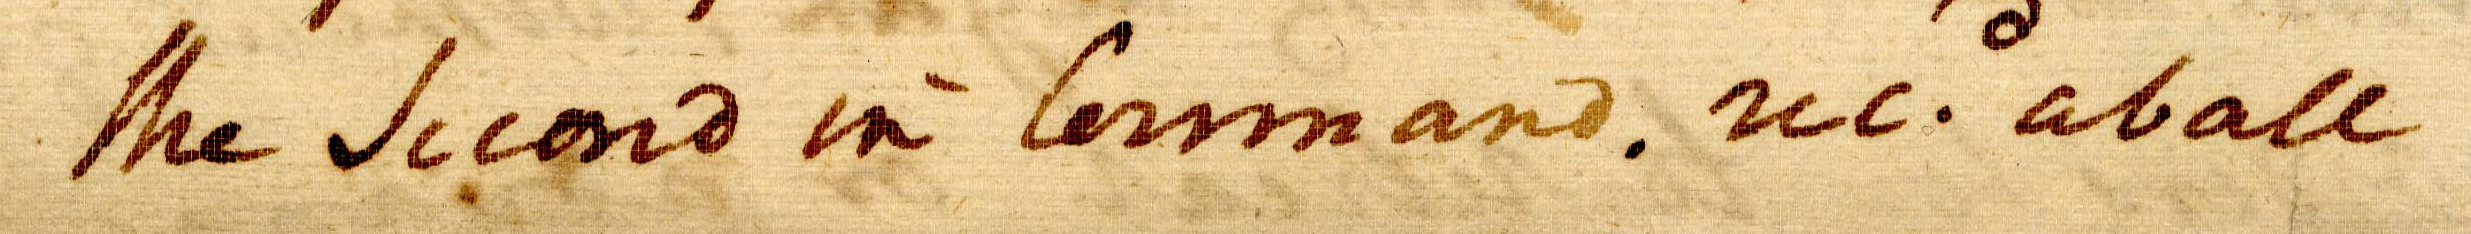the Second in Command. rec^d. aball
